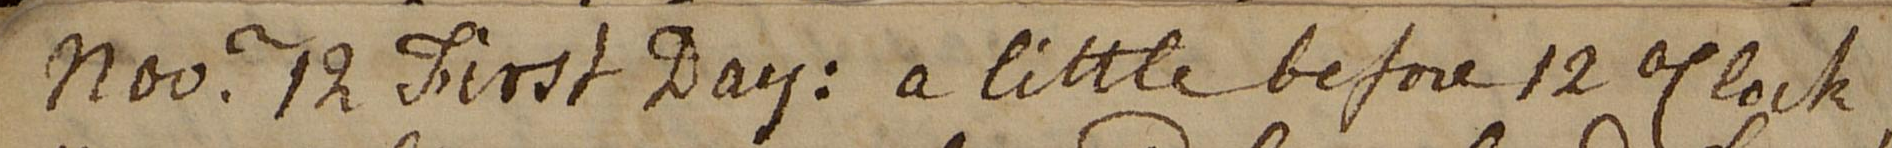Nov^r. 12 First Day: a little before 12 ^o Clock
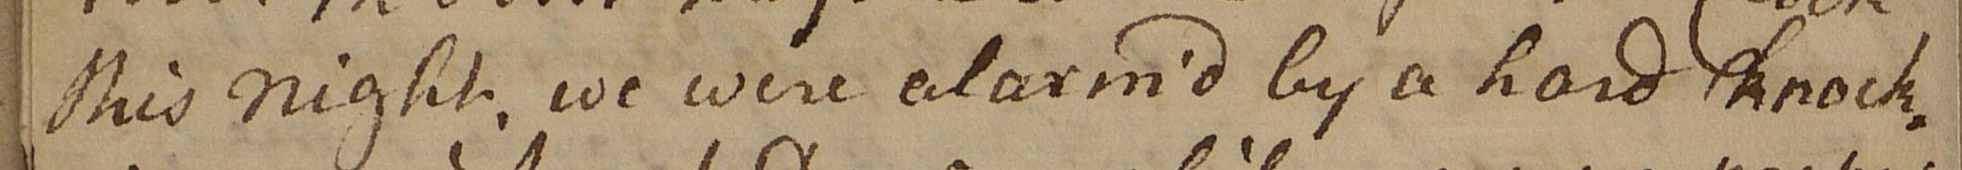this night, we were alarm'd by a hard knock,
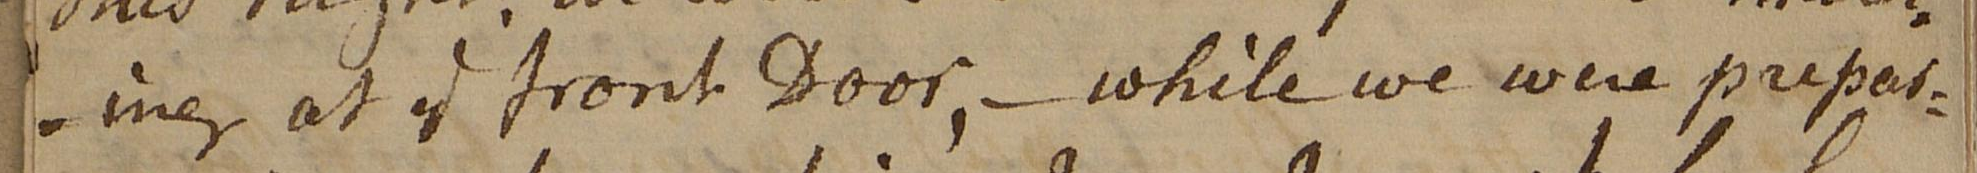-ing, at y^e front Door- while we were prepar-
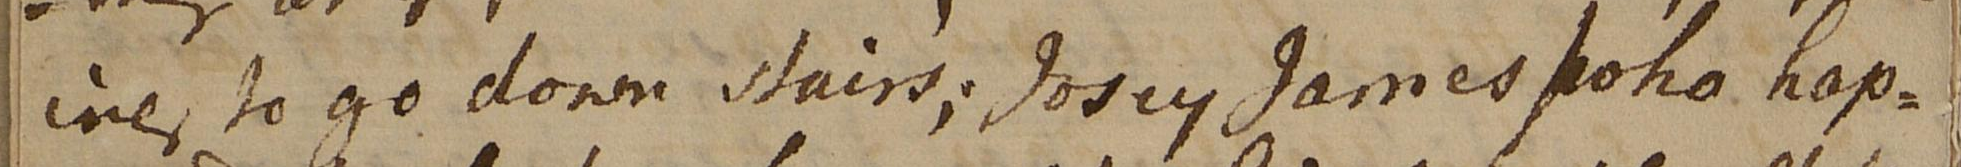ing to go down stairs; Josey James poho hap-
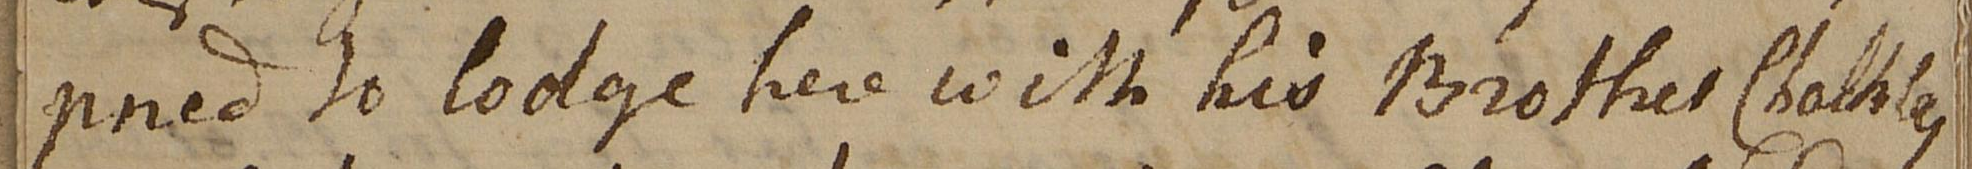pned to lodge here with his Brother Chalkley
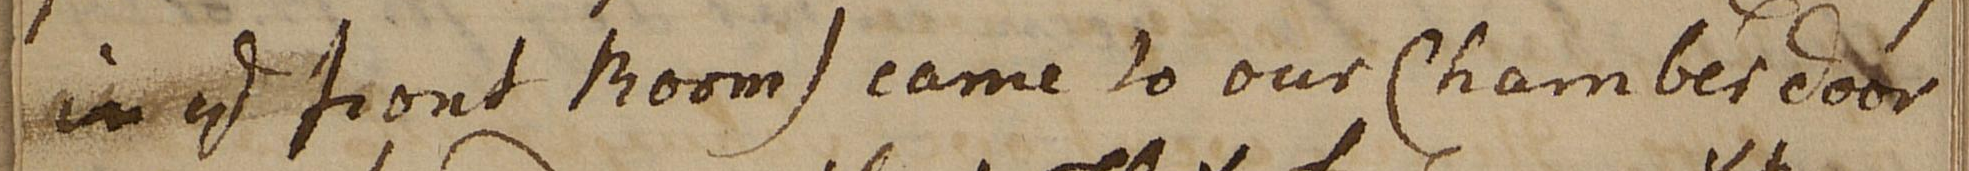in y^e front Room) came to our Chamber door
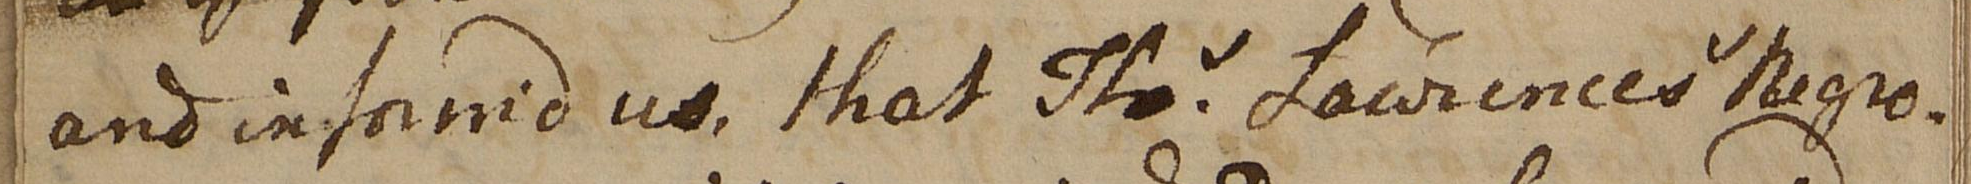and inform'd us, that Tho^s. Lawrences^s Negro-
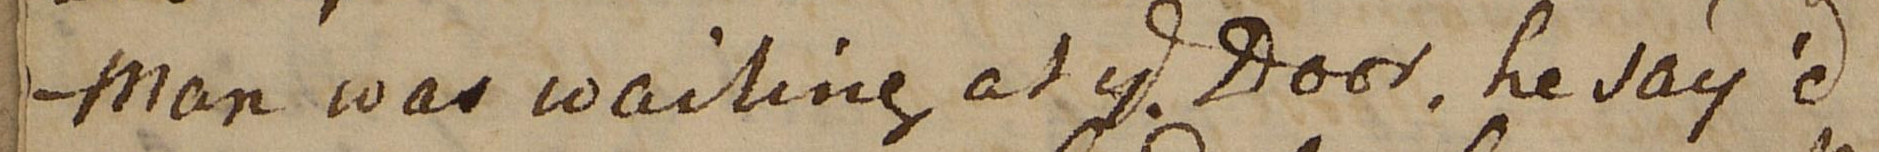-Man was waiting at y^e Door, he say 'd
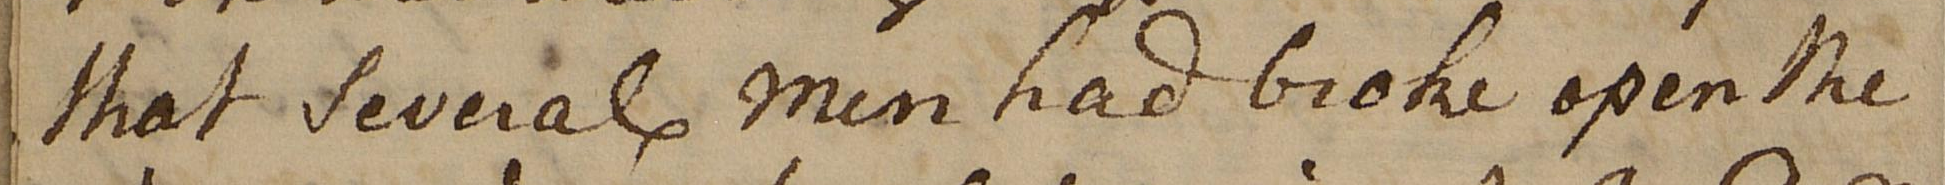that Several Men had broke open the
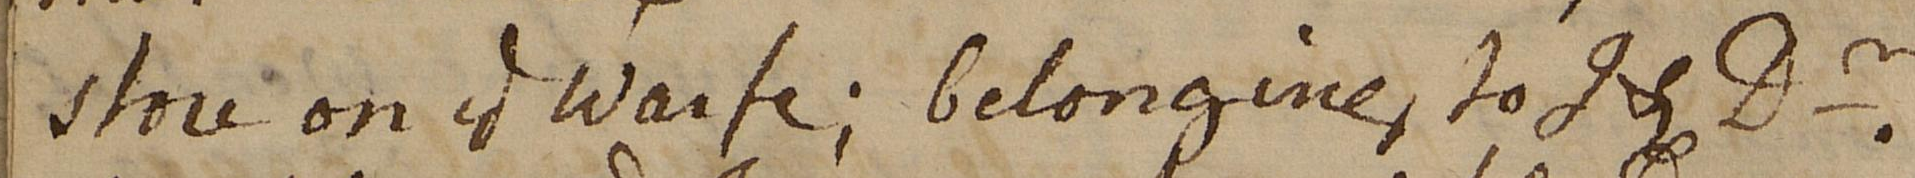store on y^e warfe; belonging to J & D^r-
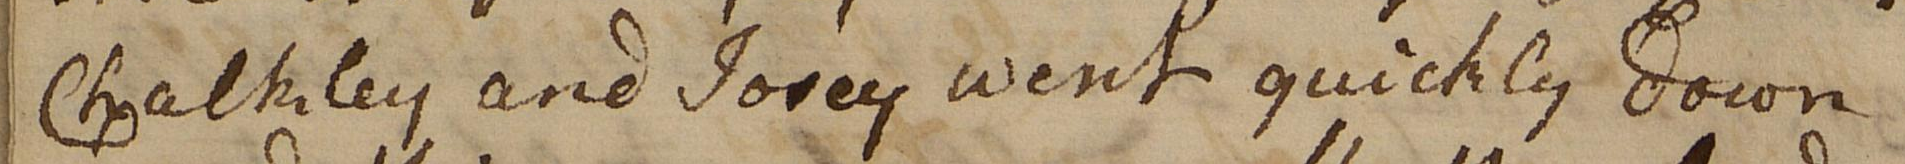Chalkley and Josey went quickly down
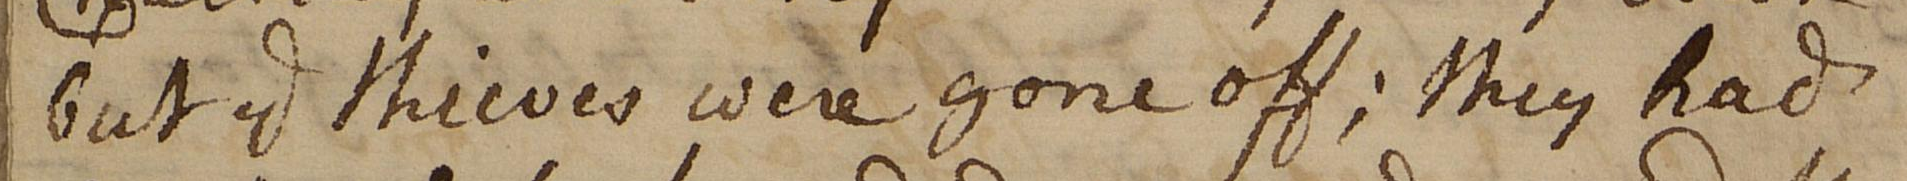but y^e thieves were gone off; they had
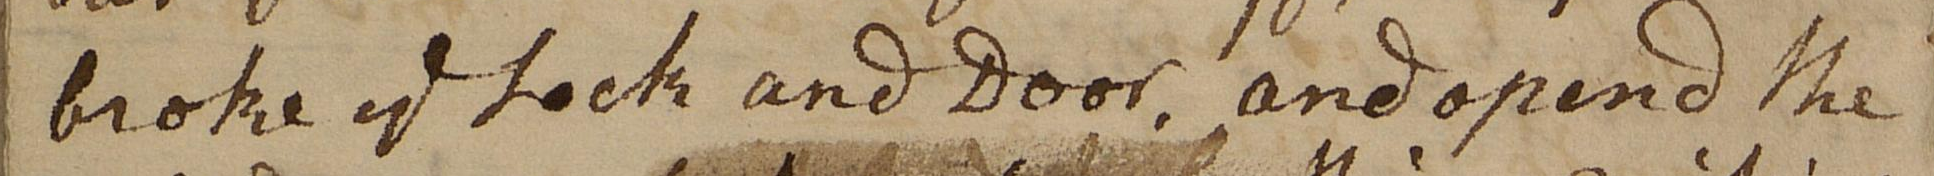broke y^e Lock and Door, and opend the
